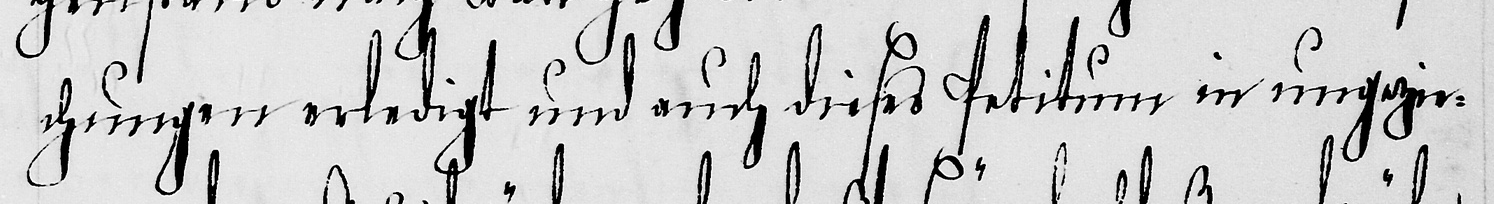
chungen erledigt und auch dieses Petitum in ungezie¬
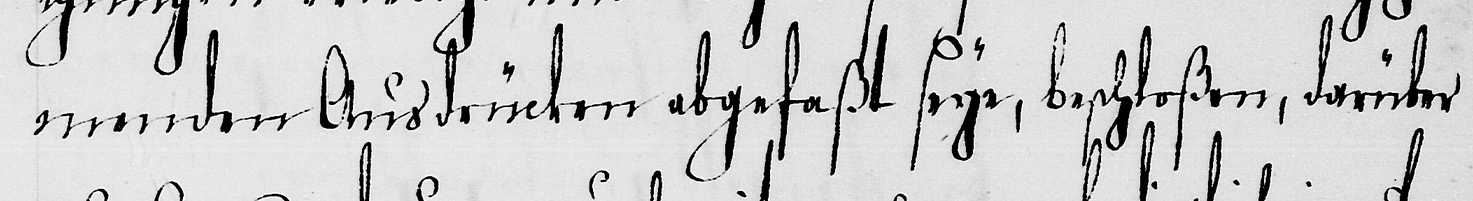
menden Ausdrücken abgefaßt seye, beschloßen, darüber
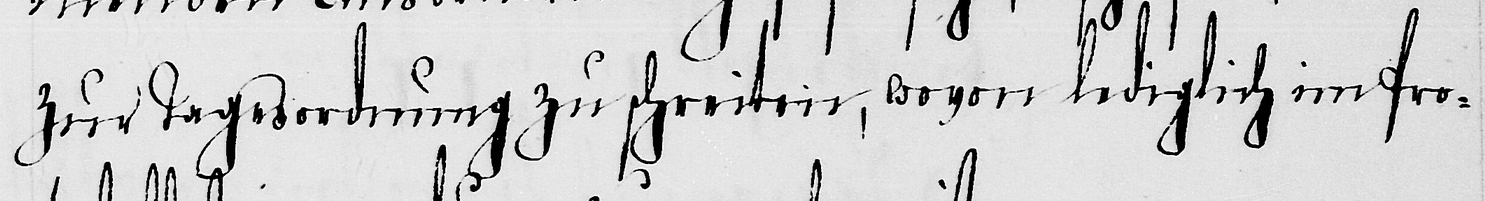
zur Tagesordnung zu schreiten, wovon lediglich im Pro¬
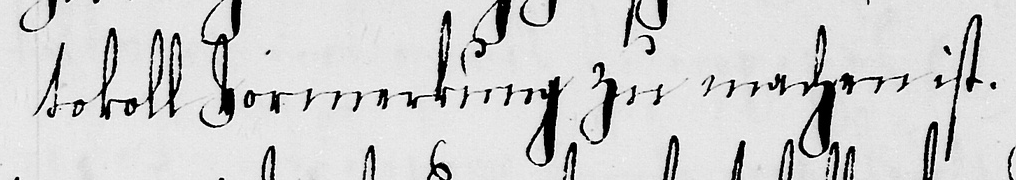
tokoll Vormerkung zu machen ist.
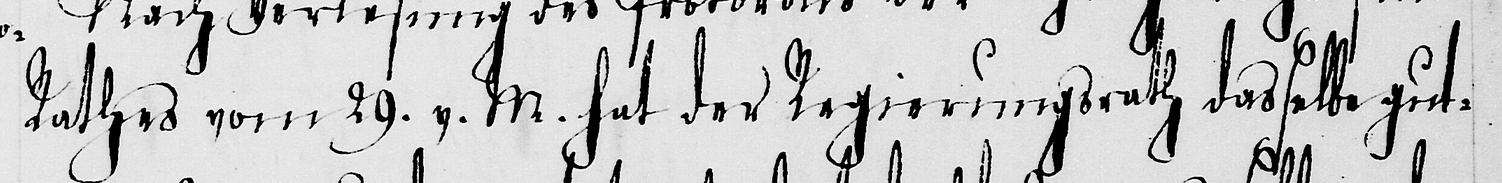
Rathes vom 29. v. M. hat der Regierungsrath dasselbe gut¬
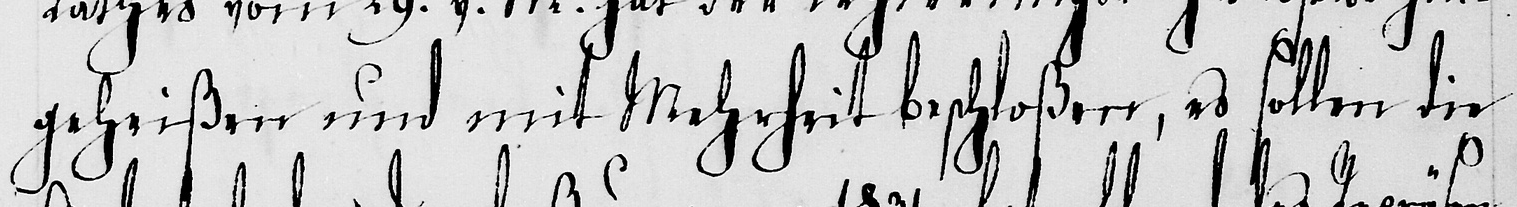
geheißen und mit Mehrheit beschloßen, es sollen die
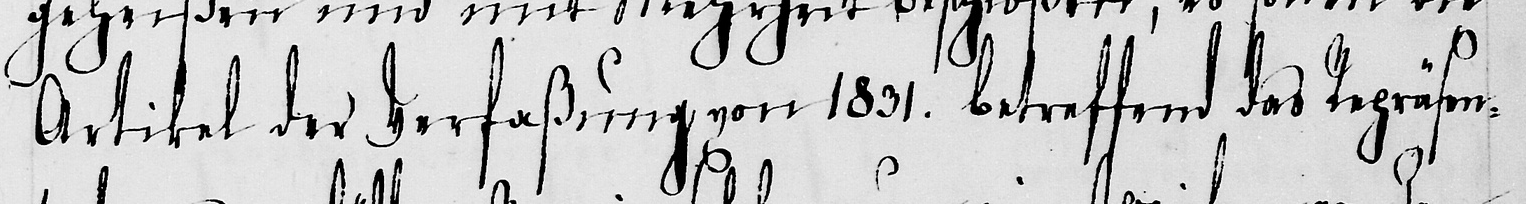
Artikel der Verfaßung von 1831. betreffend das Repräsen¬
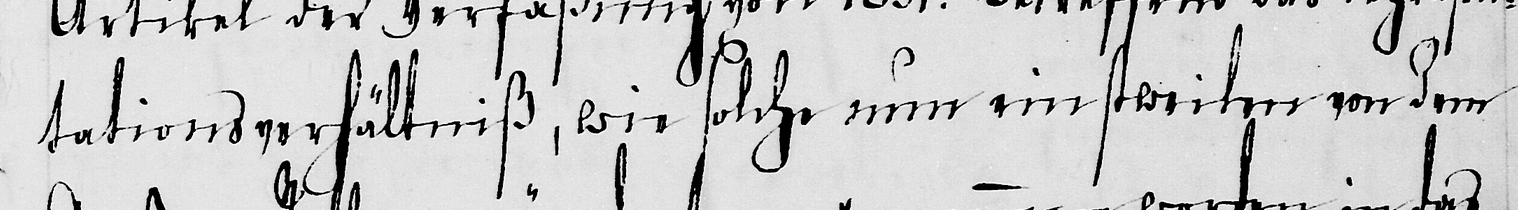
tationsverhältniß, wie solche um einstweilen von dem
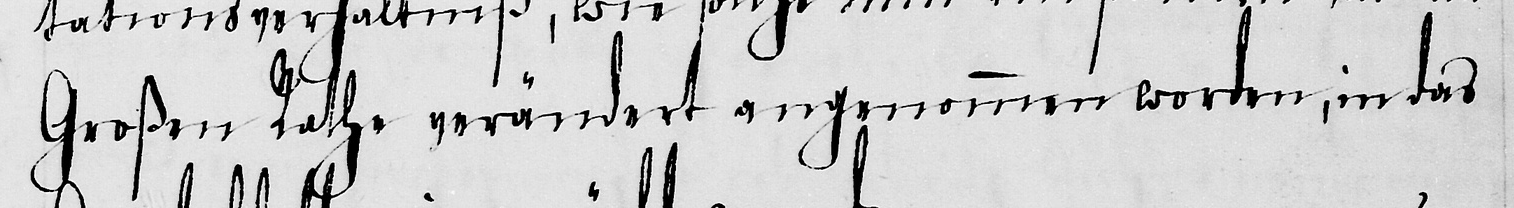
Großen Rathe verändert angenommen worden, in das
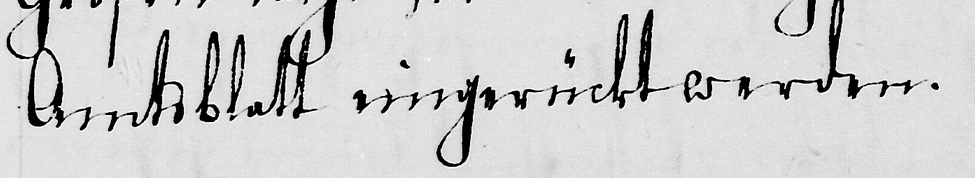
Amtsblatt eingerückt werden.
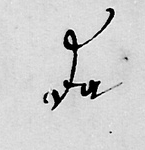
des
